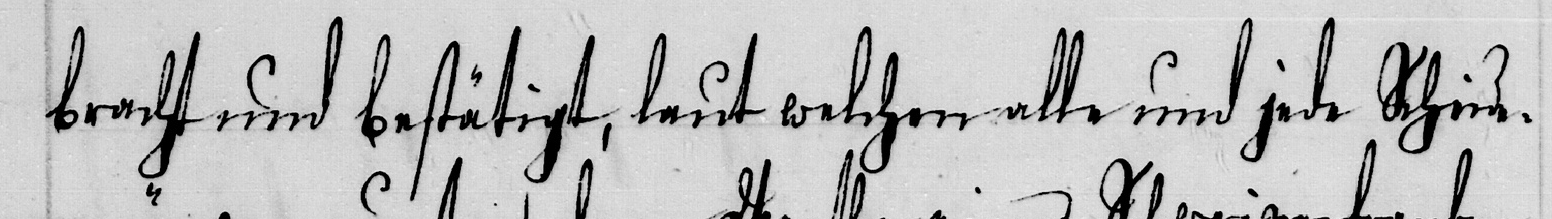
bracht und bestätigt, laut welchen alle und jede Schei¬
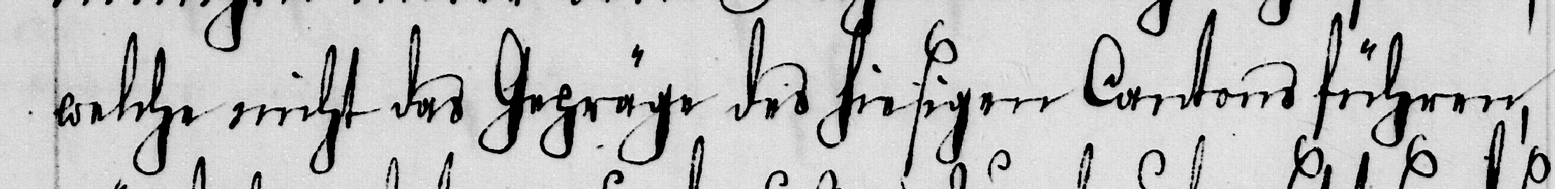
welche nicht das Gepräge des hiesigen Cantons führen,
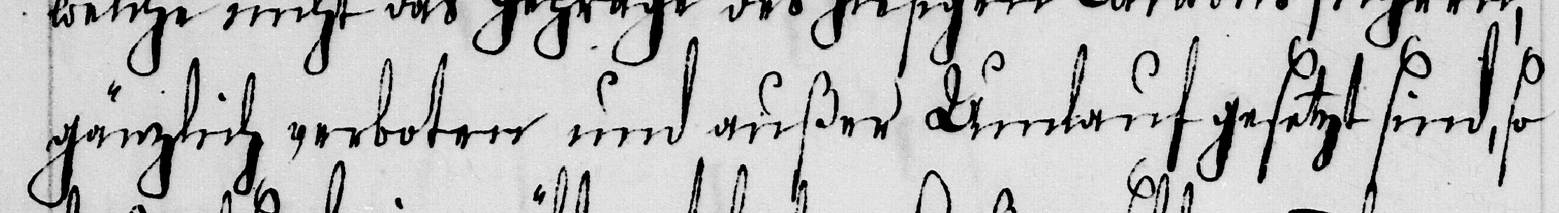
gänzlich verboten und außer Umlauf gesetzt sind
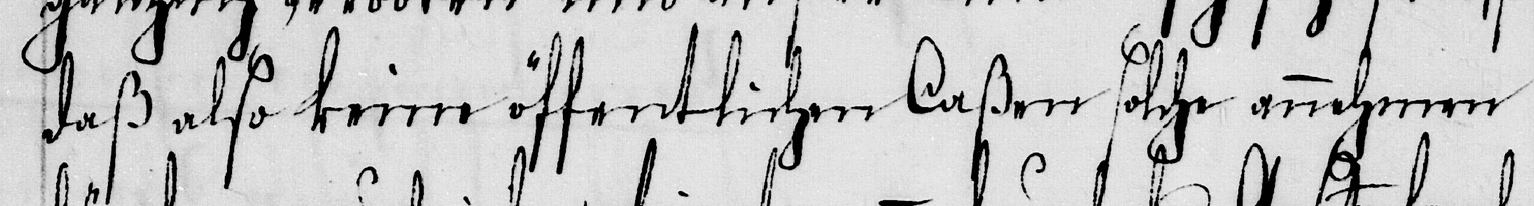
daß also keine öffentlichen Caßen solche annehmen
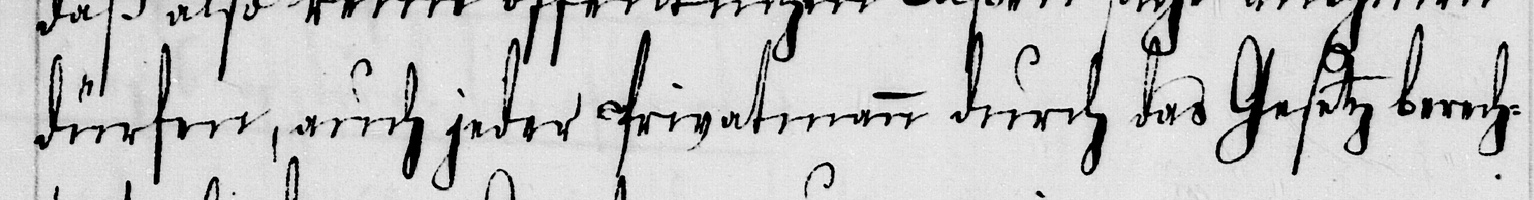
dürfen, auch jeder Privatmann durch das Gesetz berec¬
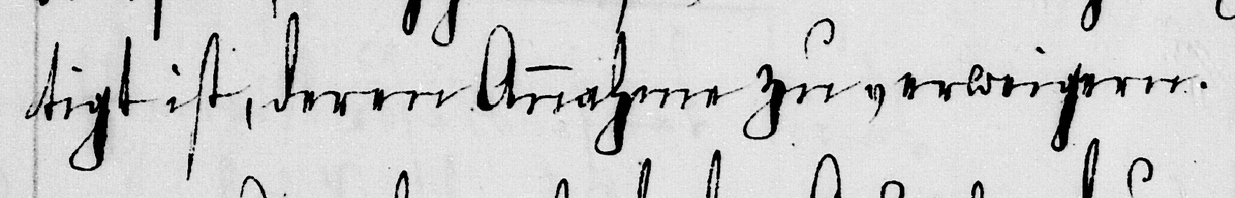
htigt ist, deren Annahme zu verweigern.
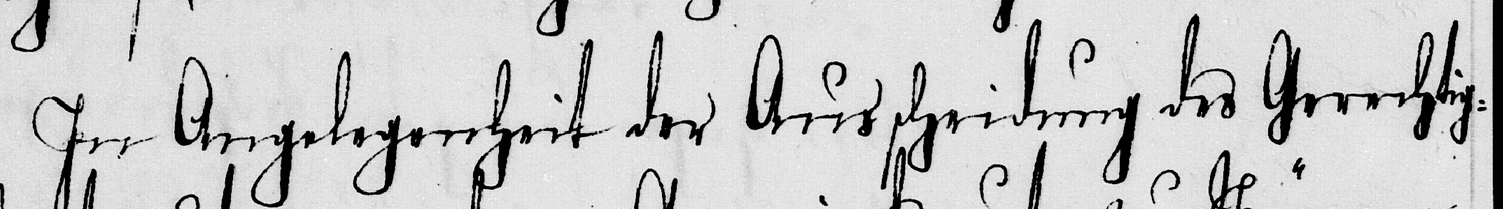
In Angelegenheit der Ausscheidung des Gerechti¬
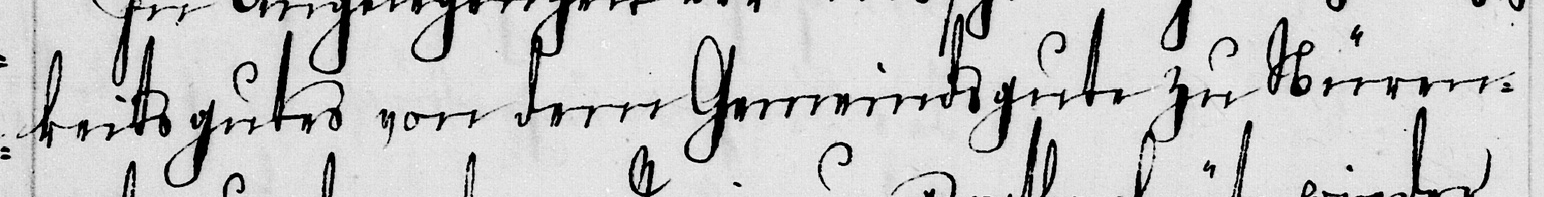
gkeitsgutes von dem Gemeindsgute zu Nüren¬
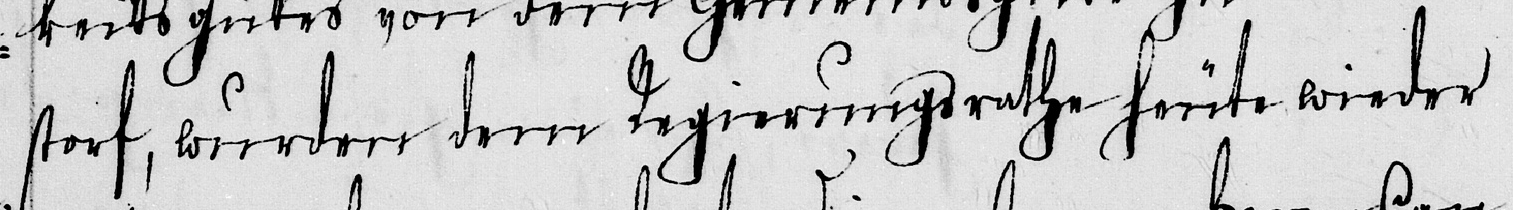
storf, wurden dem Regierungsrathe heute wieder
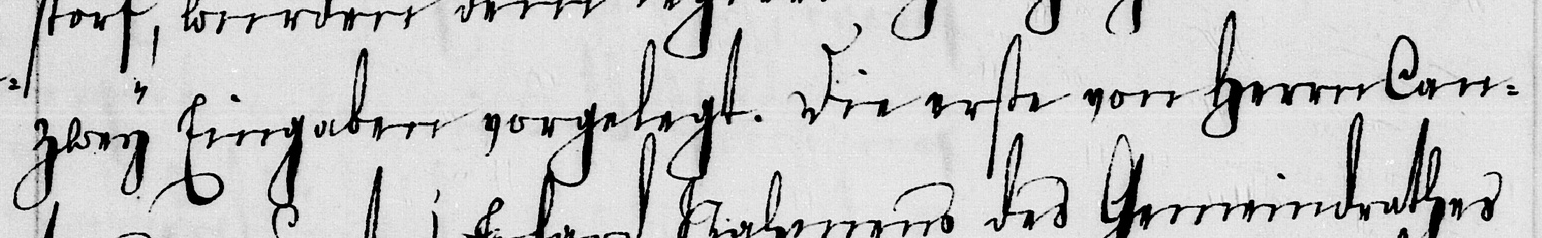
zwey Eingaben vorgelegt. Die erste von Herrn Can¬
